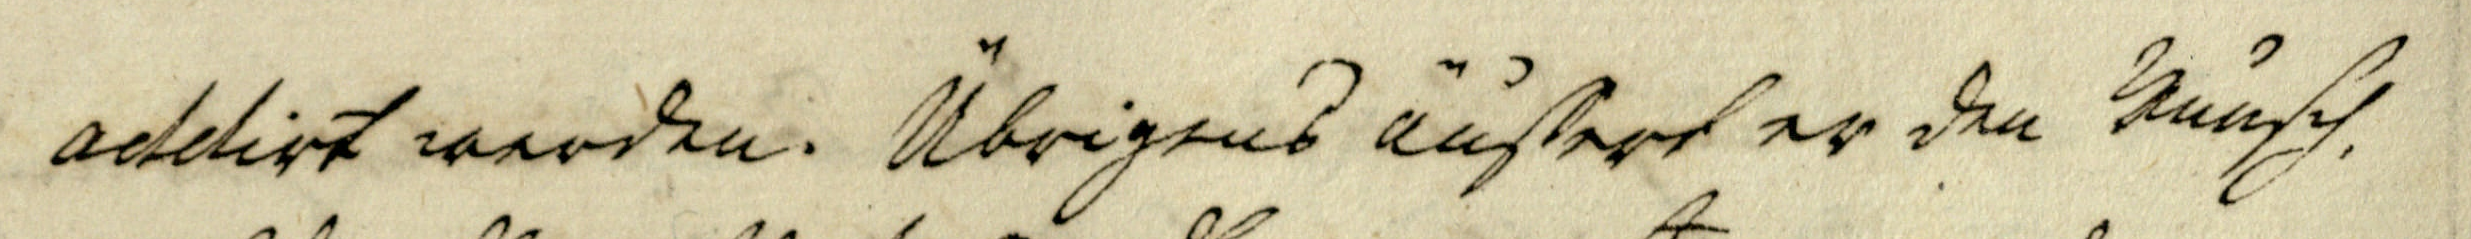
addirt werden. Übrigens äussert er den Wunsch,
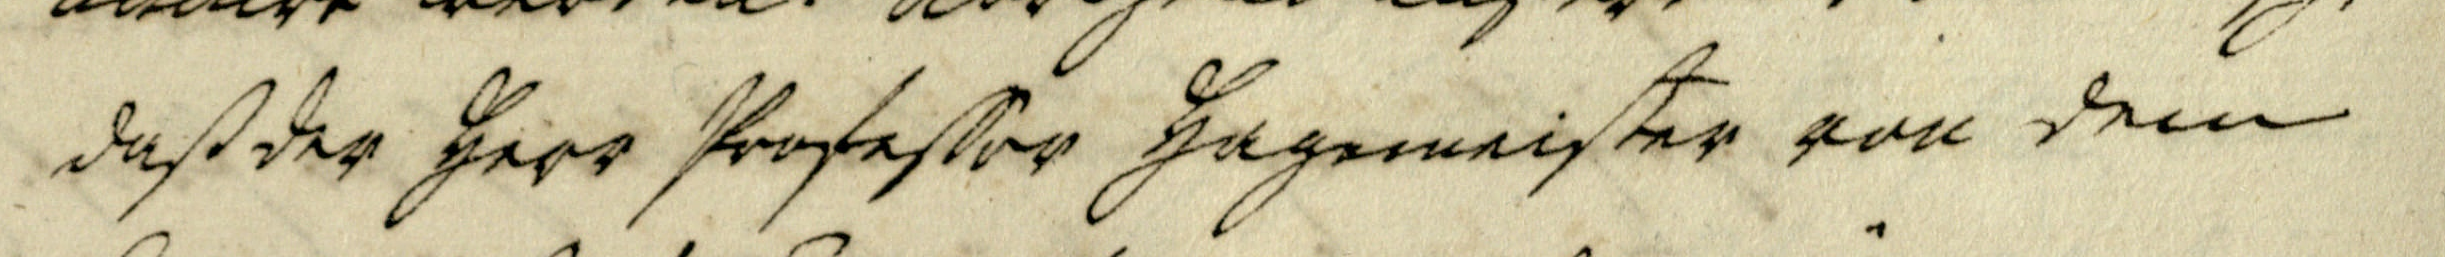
daß der Herr Professor Hagemeister von dem
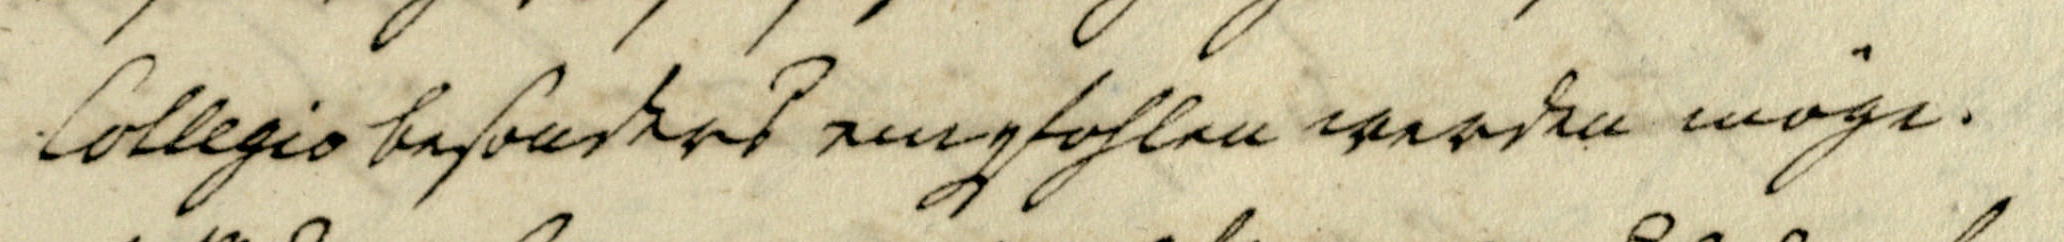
Collegio besonders empfohlen werden möge.
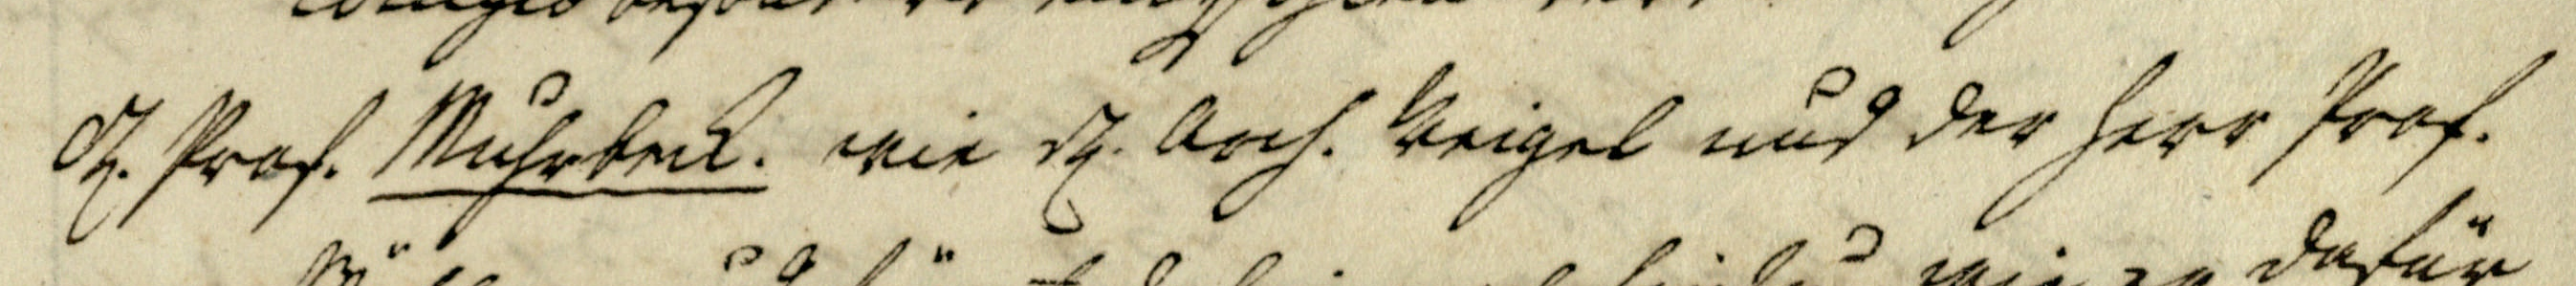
dh. Prof. Muhrbeck. wie dh. Arch. Weigel und der Herr Prof.
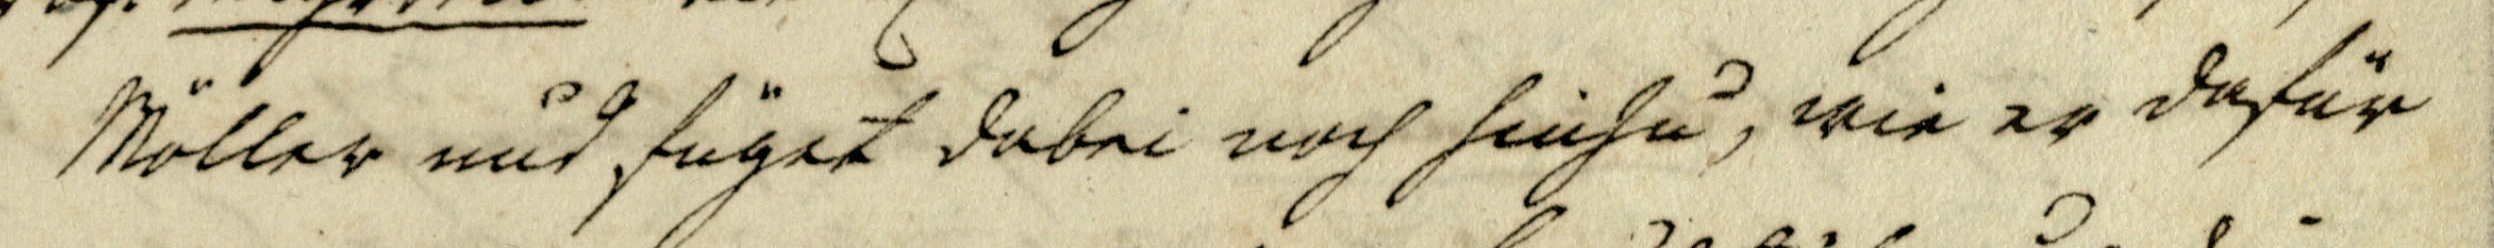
Möller und füget dabei noch hinzu, wie er dafür
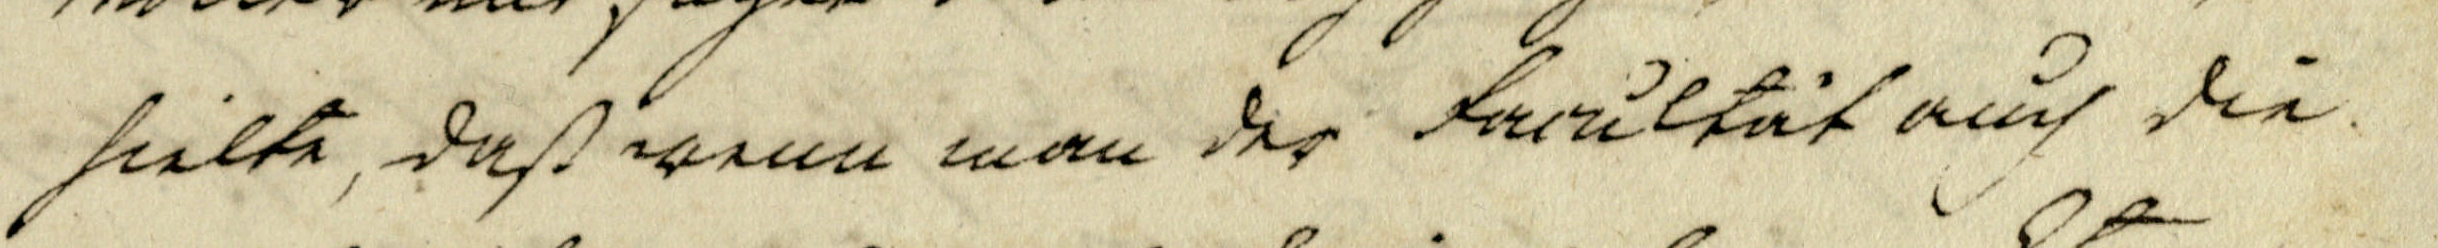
hielte, daß wenn man der Facultät auch die
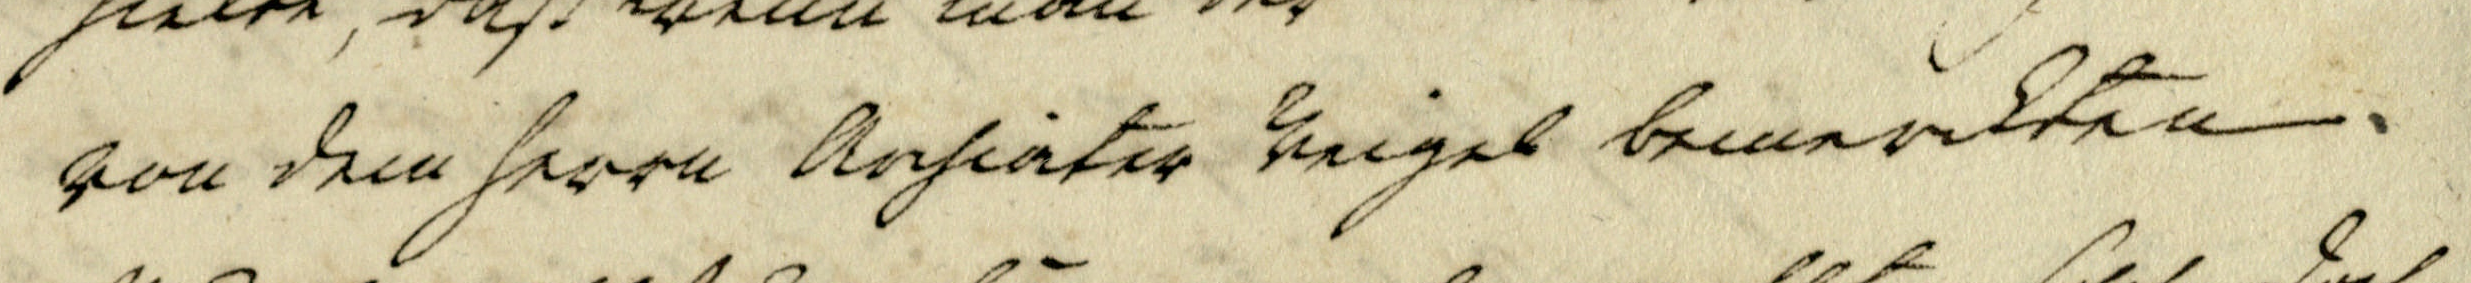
von dem Herrn Archiater Weigel bemerckten
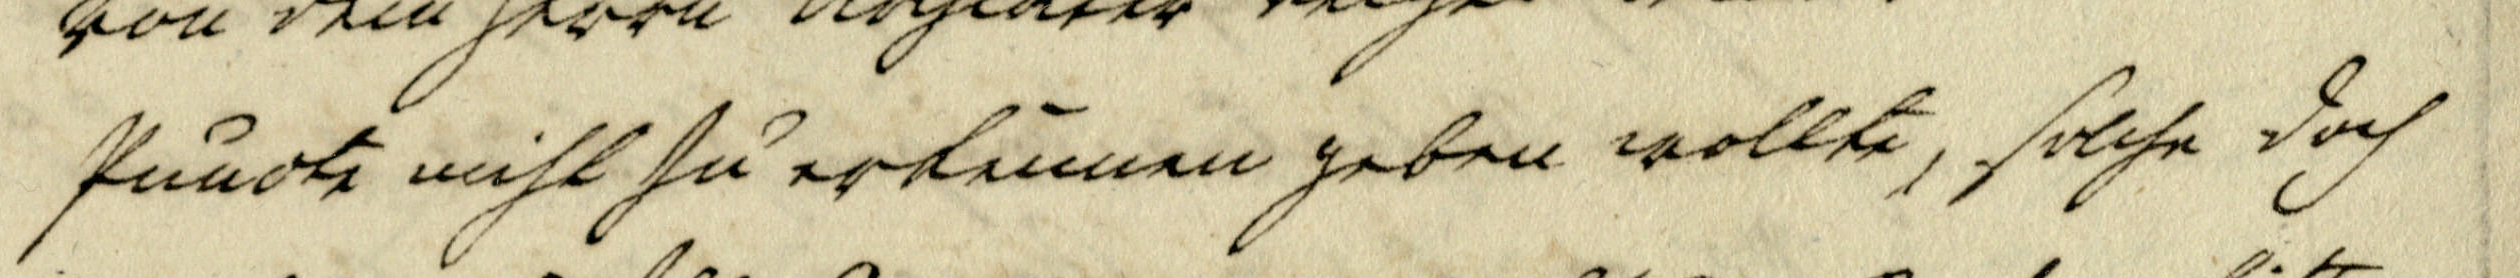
Puncte nicht zu erkennen geben wollte, solche doch
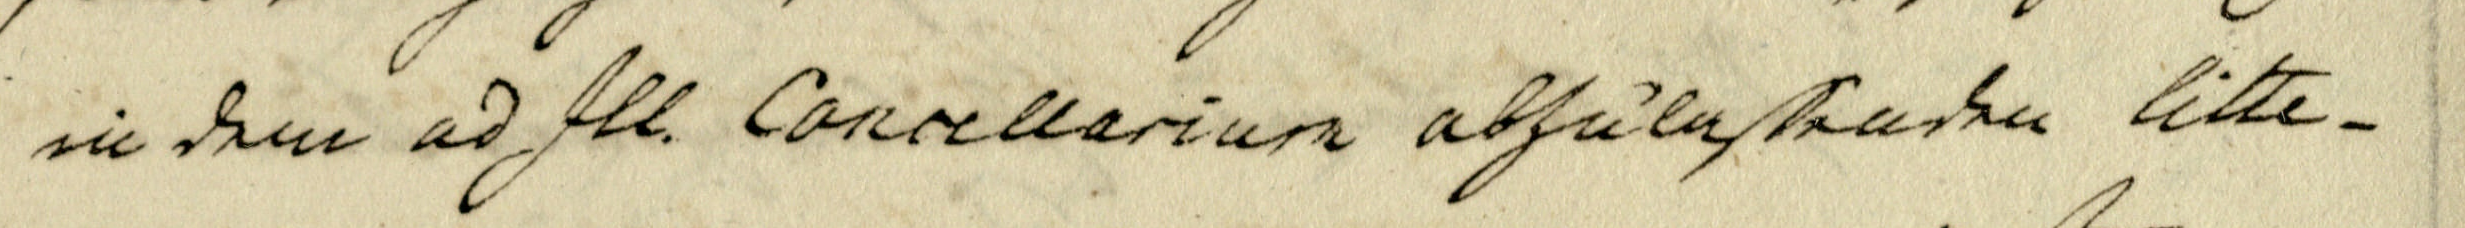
in dem ad Ill. Concellarium abzulassenden litte¬
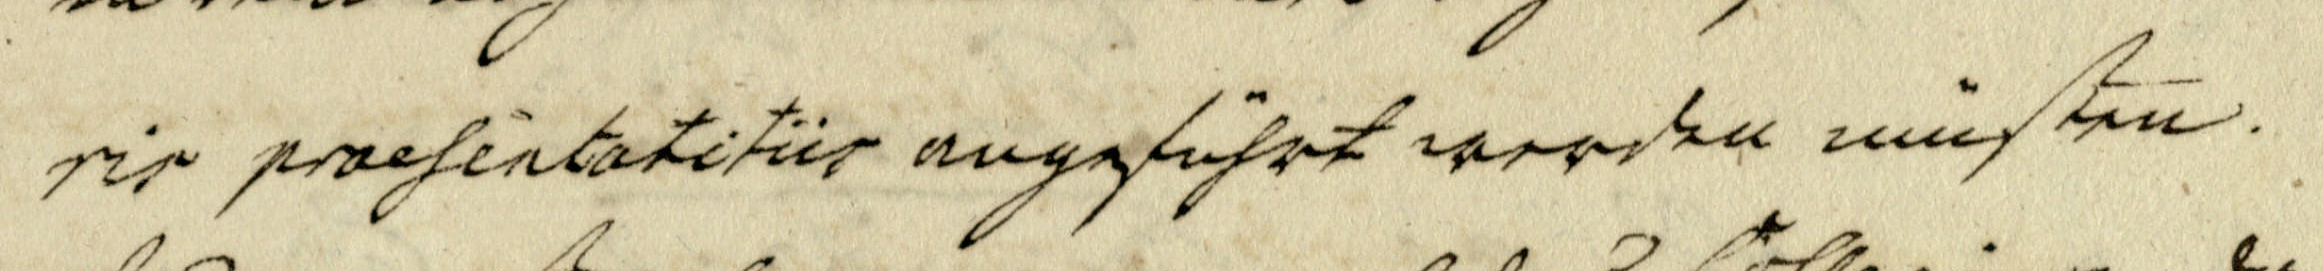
ris praesentatitiis angeführt werden müßten.
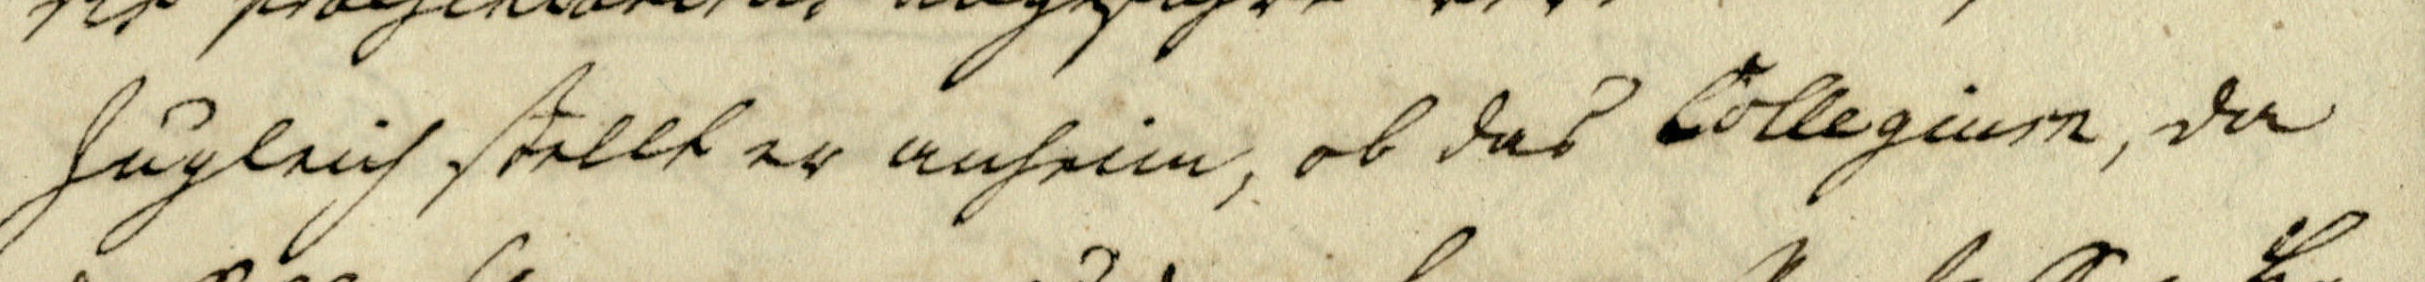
Zugleich stellt er anheim, ob das Collegium, da
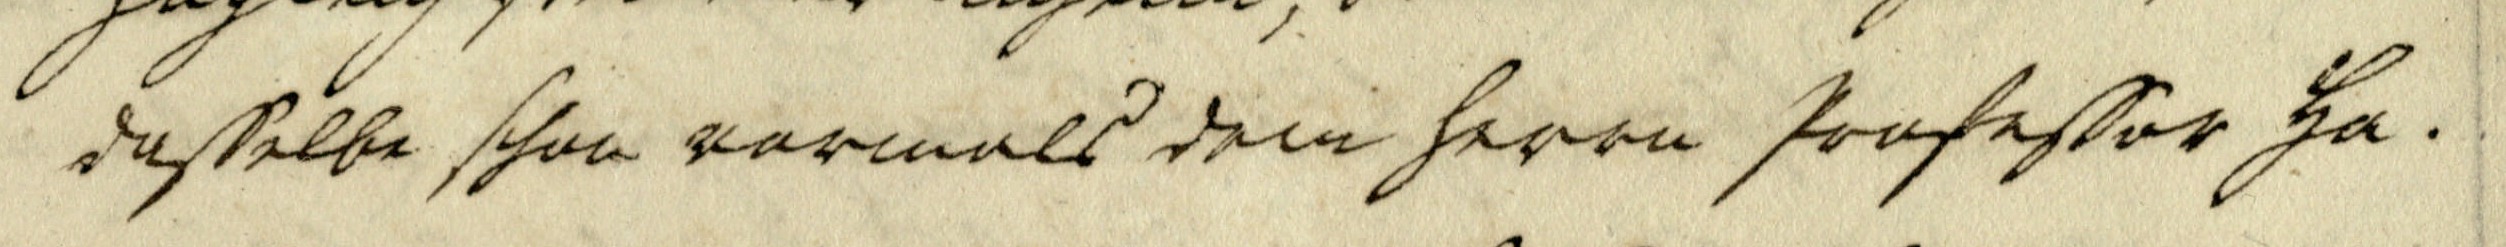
dasselbe schon vormals dem Herrn Professor Ha¬
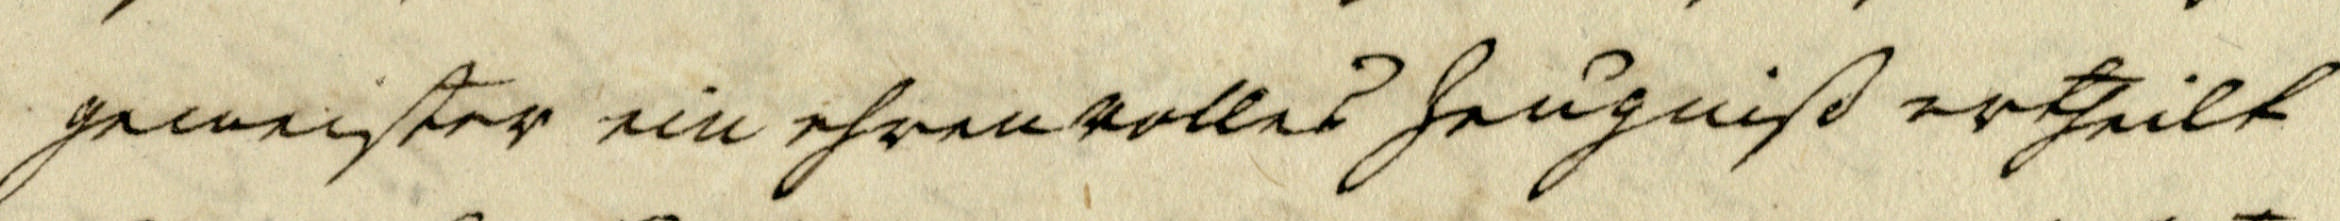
gemeister ein ehrenvolles Zeugniß ertheilt
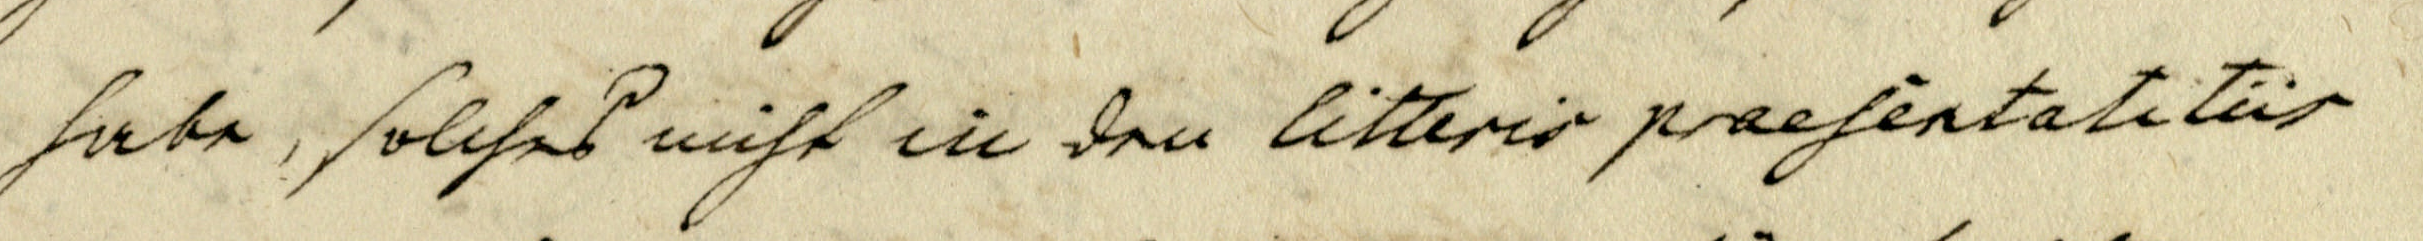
habe, solches nicht in den litteris praesentatitiis
